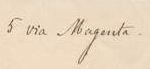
5. Via Magenta.
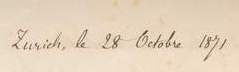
Zurich, le 28 Octobre 1871
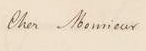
Cher Monsieur
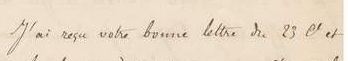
J'ai reçu votre bonne lettre du 23 Ct et
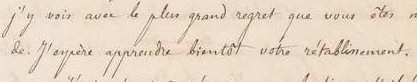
le plus grand regret que vous
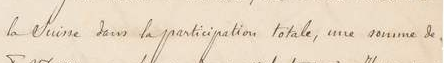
la Suisse dans la participation totale, une somme de
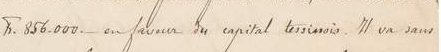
Fr. 856.000.– en faveur du capital tessinois. Il va sans
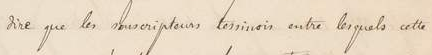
dire que les souscripteurs tessinois entre lesquels cette
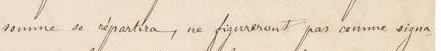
somme se répartira, ne figureront pas comme signa--
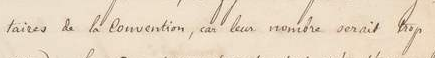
taires de la Convention, car leur nombre serait trop
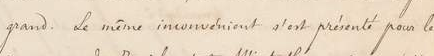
grand. Le même inconvénient s'est présenté pour le
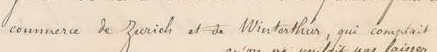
commerce de Zurich et de Winterthur, qui comptait
